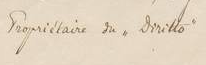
Propriétaire du «Diritto»
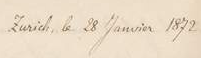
Zurich, le 28 Janvier 1872
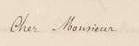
Cher Monsieur
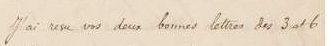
J'ai reçu vos deux bonnes lettres des 3 et 6
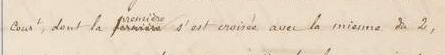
Court, dont la dernièrepremière s'est croisée avec la mienne du 2,
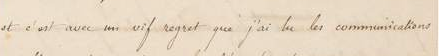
et c'est avec un vif regret que j'ai lu les communications
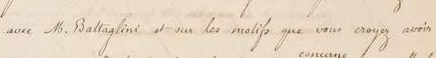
avec M. Battaglini et sur les motifs que vous croyez avoir
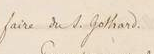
faire du S. Gothard.
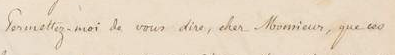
Permettez-moi de vous dire, cher Monsieur, que ces
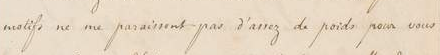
motifs ne me paraissent pas d'assez de poids pour vous
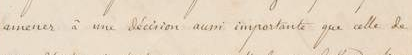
amener à une décision aussi importante que celle de
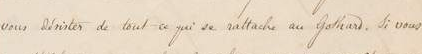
vous désister de tout ce qui se rattache au Gothard. Si vous
